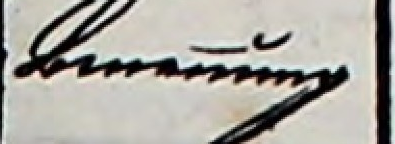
Benennung
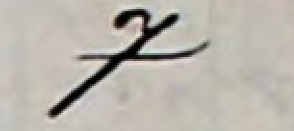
7
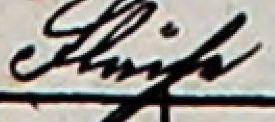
Fläche
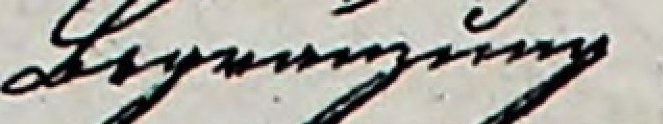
Begränzung
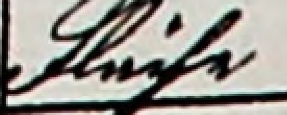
Fläche
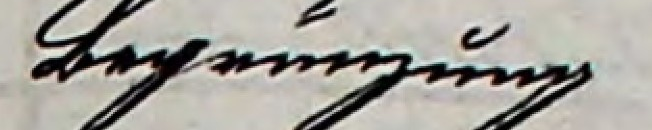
Begränzung
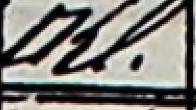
Ckl.
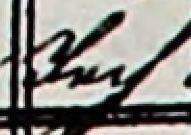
Tech
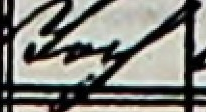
Tech
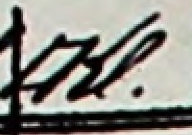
Ckl.
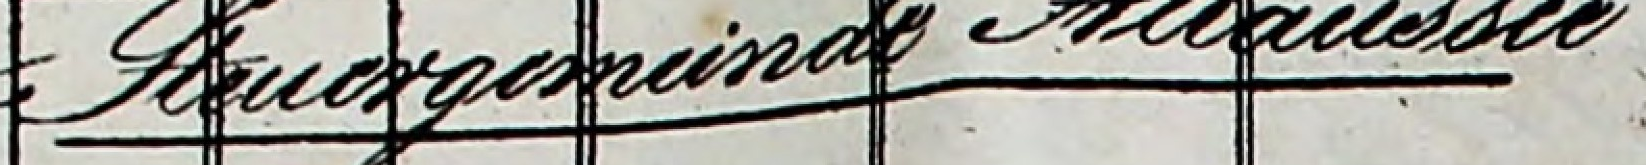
Steuergemeinde Altaussee
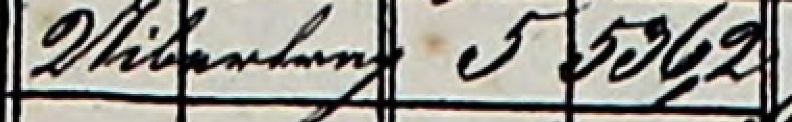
Uibertrag 5 536,2
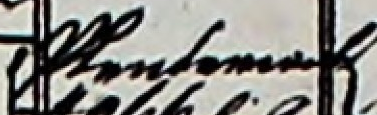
Plenterwald
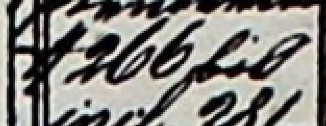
N 266 bis
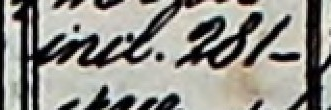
incl. 281-
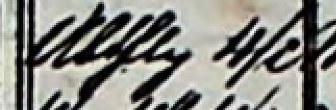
Al??llg 4/c
